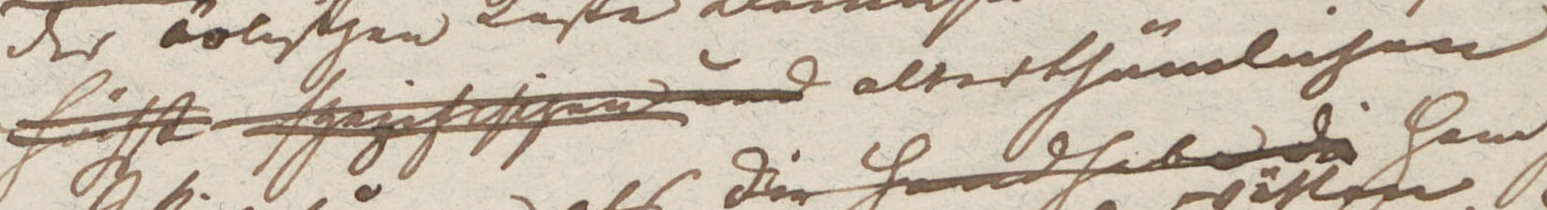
höchst spezifischen und alterthümlichen
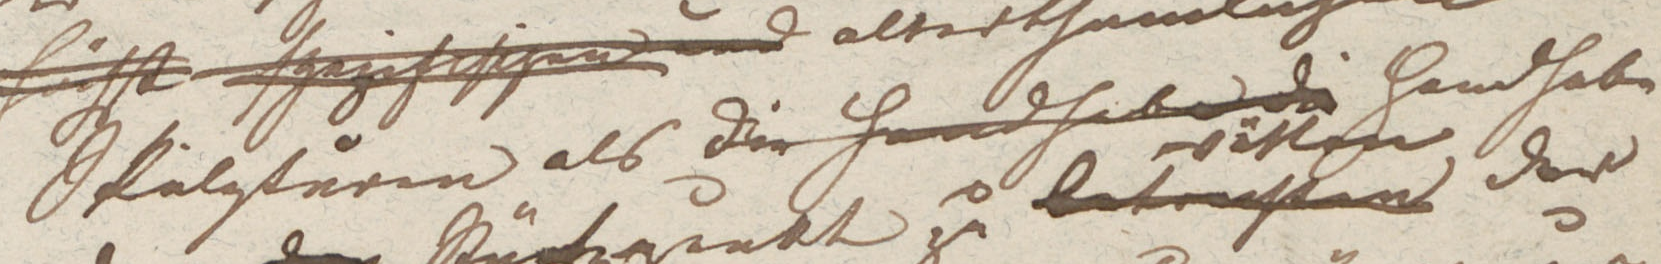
Skulpturen als die Handhabe die Handhabe
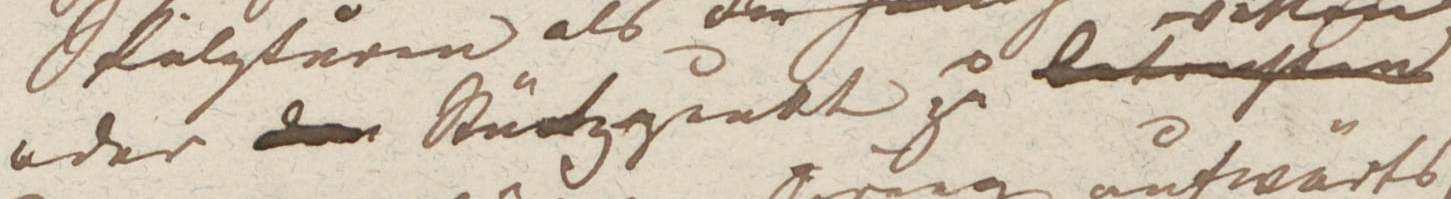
oder den Stützpunkt zu betrachten
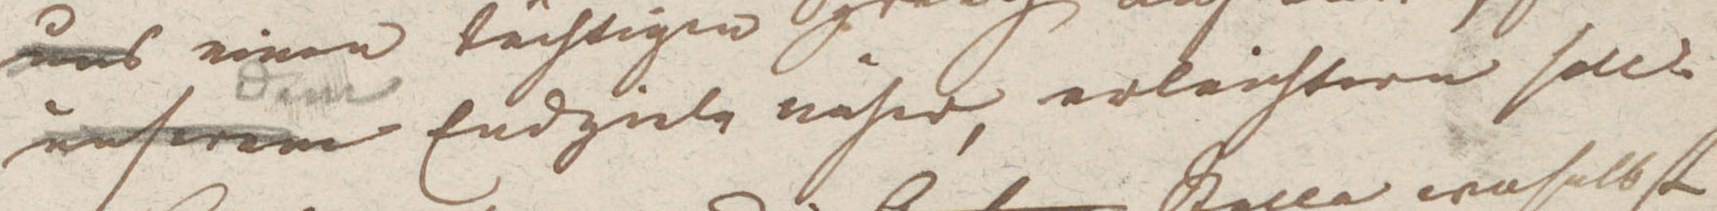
unserem dem Endziele näher, erleichtern soll.
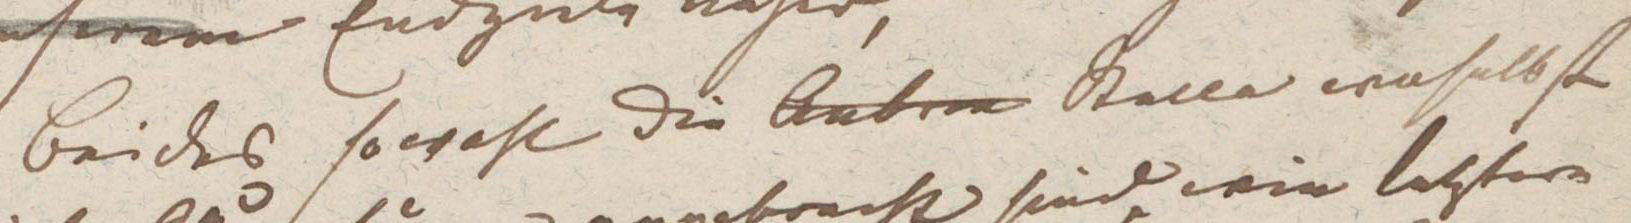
Beides sowohl die Anb Stelle woselbst
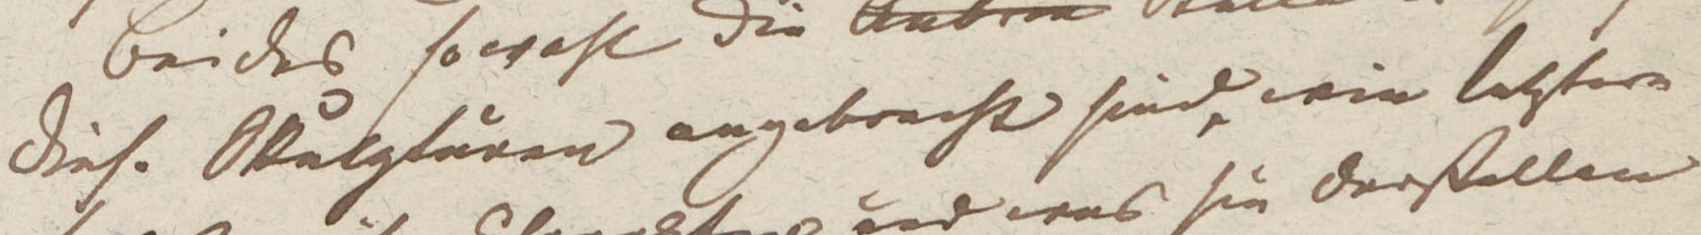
dies. Skulpturen angebracht sind, wie letztere
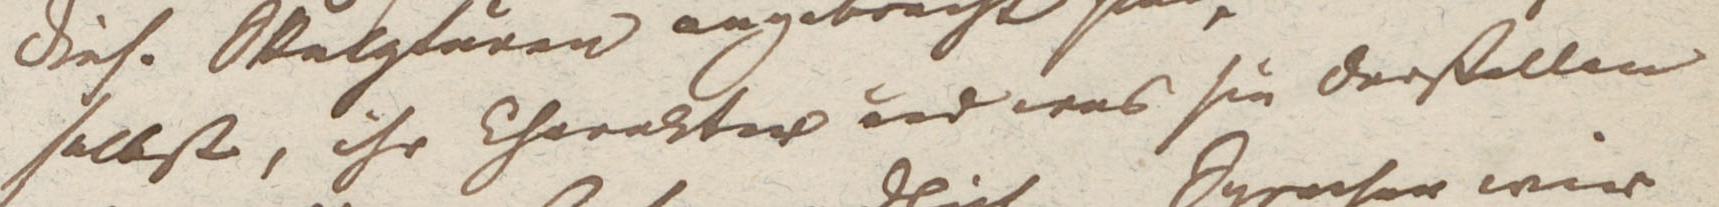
selbst, ihr Charakter und was sie darstellen
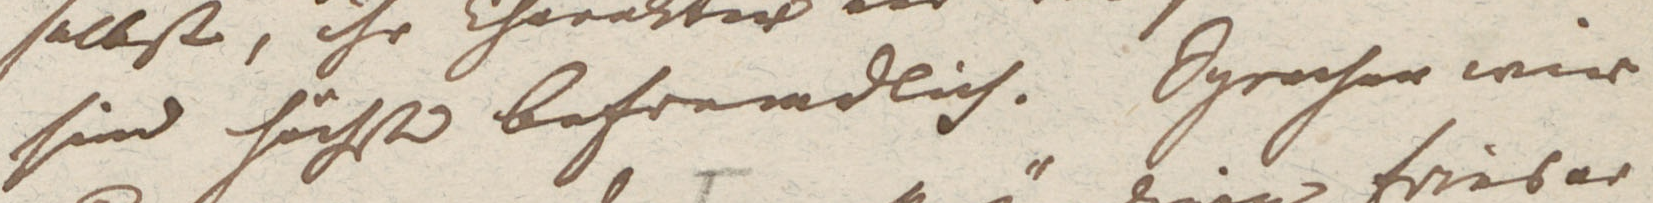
sind höchst befremdlich. Sprechen wir
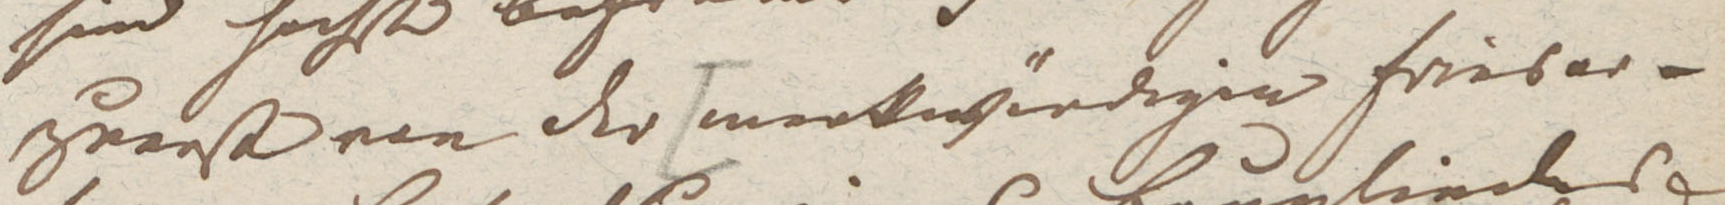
zuerst von der % merkwürdigen friesar-
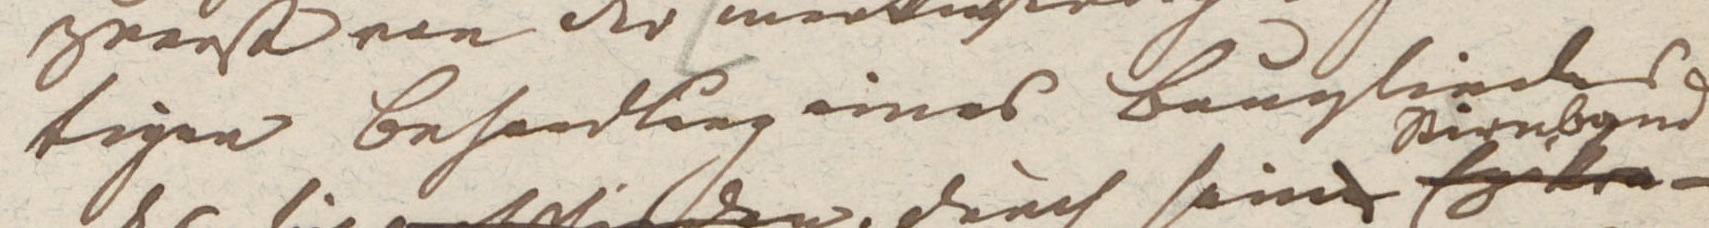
tigen Behandlung eines Baugliedes
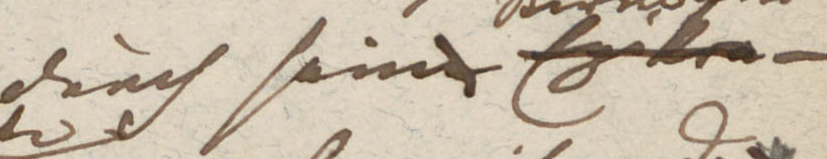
durch seine Exkre-
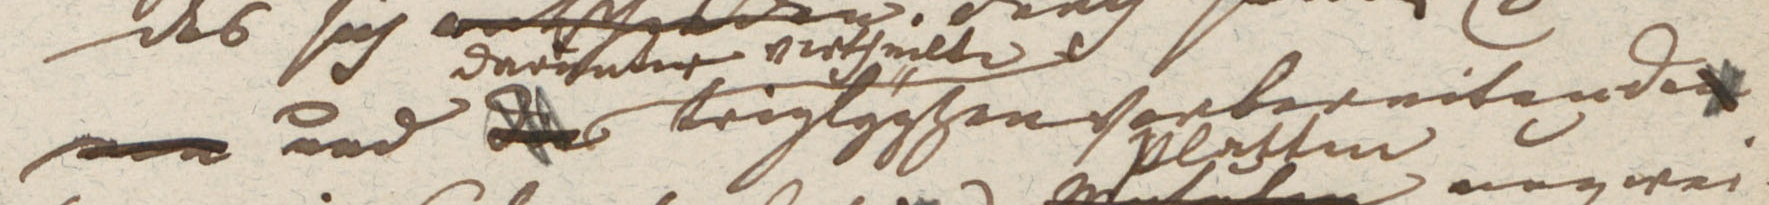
die darunter vertheilte triglyphenvorbereitenden
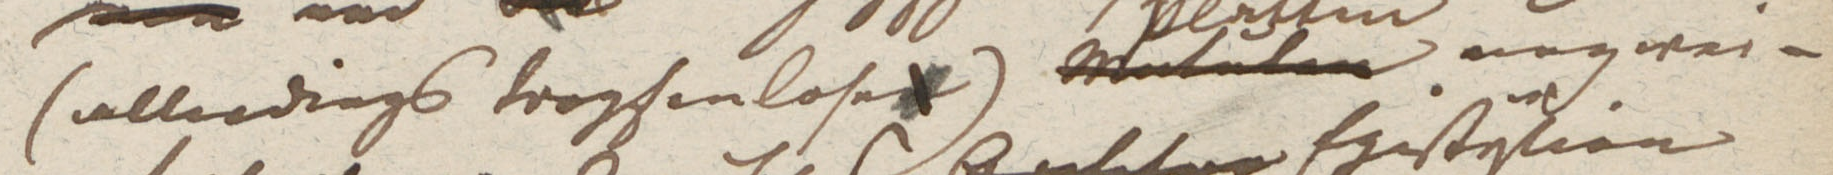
(allerdings tropfenlosen) Mutulen Platten unzwei-
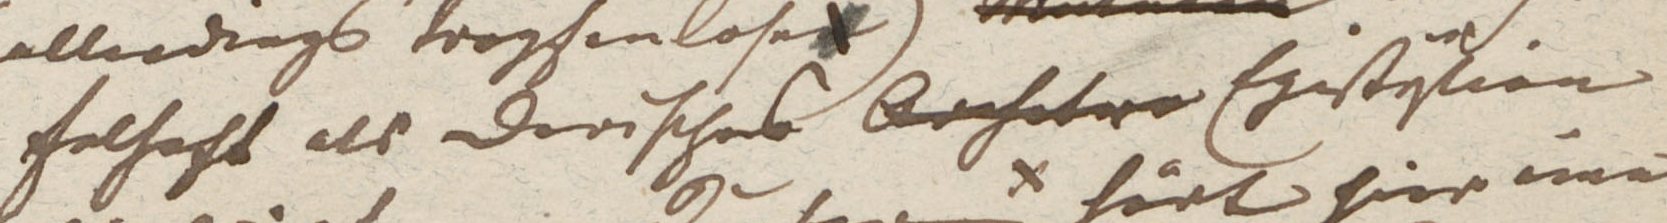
felhaft als Dorisches Architra Epistylion
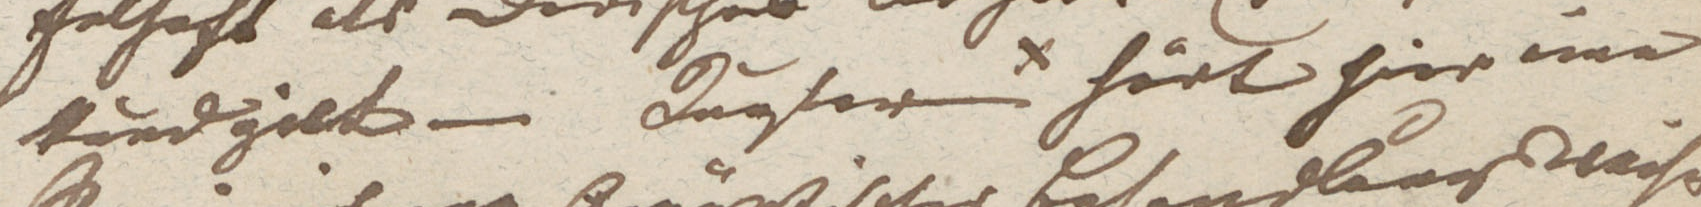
kundgibt – Kugler % hört hier eine
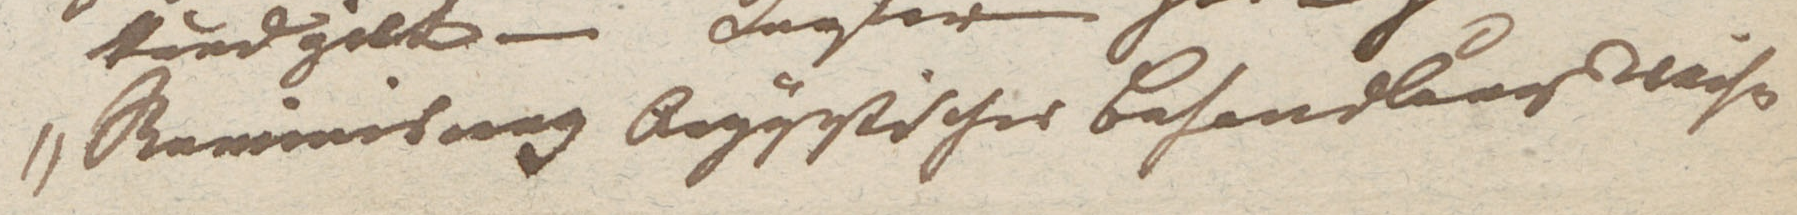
"Reminiscenz Aegyptischer Behandlungsweise
